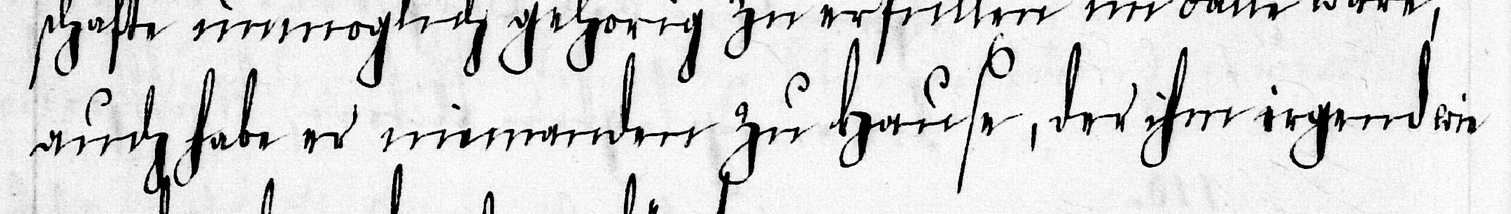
auch habe er niemanden zu Hause, der ihm irgend wie
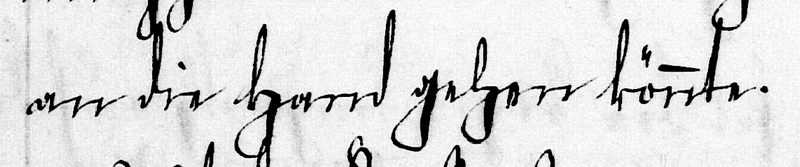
an die Hand gehen könnte.
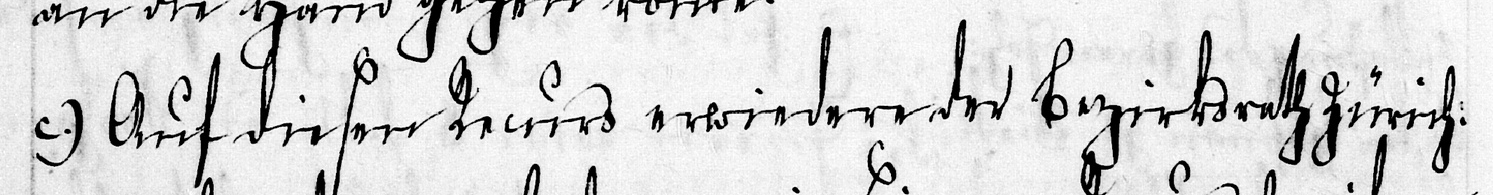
c.) Auf diesen Recurs erwiedere der Bezirksrath Zürich:
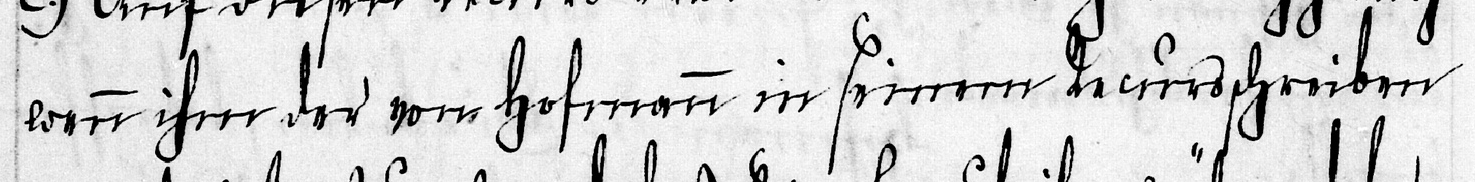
wenn ihm der von Hofmann in seinem Recursschreiben
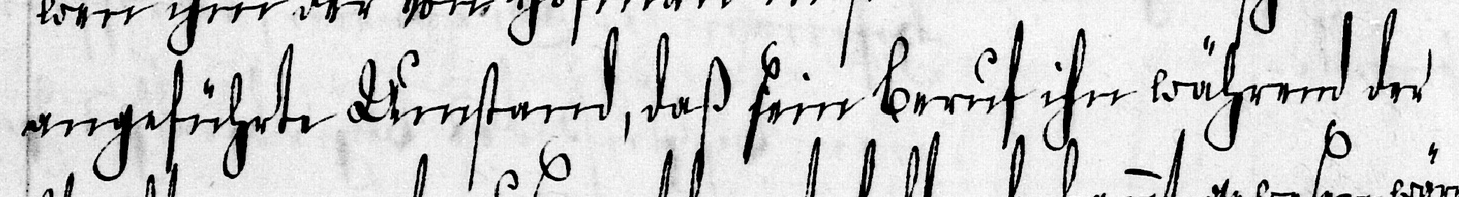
angeführte Umstand, daß sein Beruf ihn während der
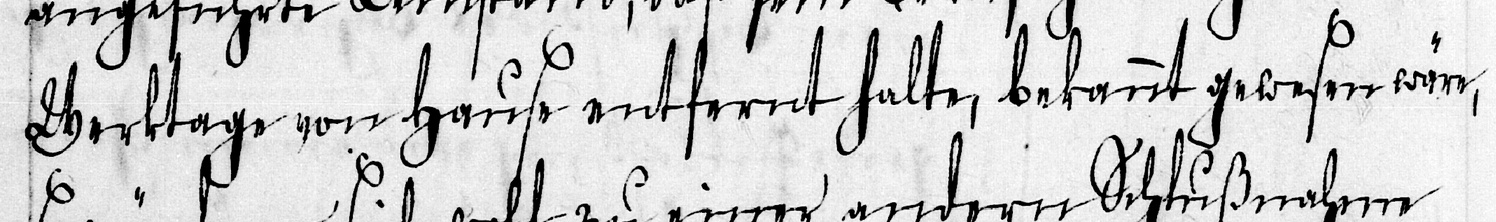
Werktage von Hause entfernt halte, bekannt gewesen wäre,
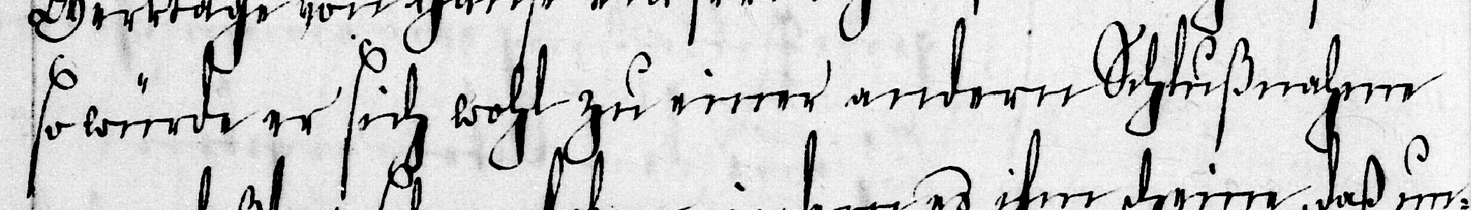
so würde er sich wohl zu einer andern Schlußnahme
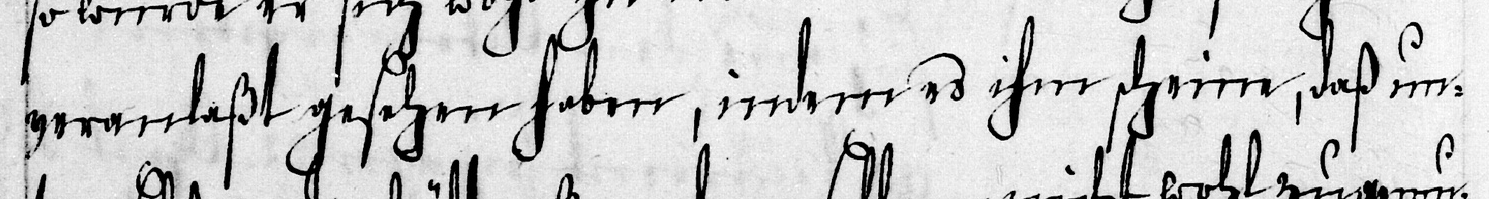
veranlaßt gesehen haben, indem es ihm scheine, daß un¬
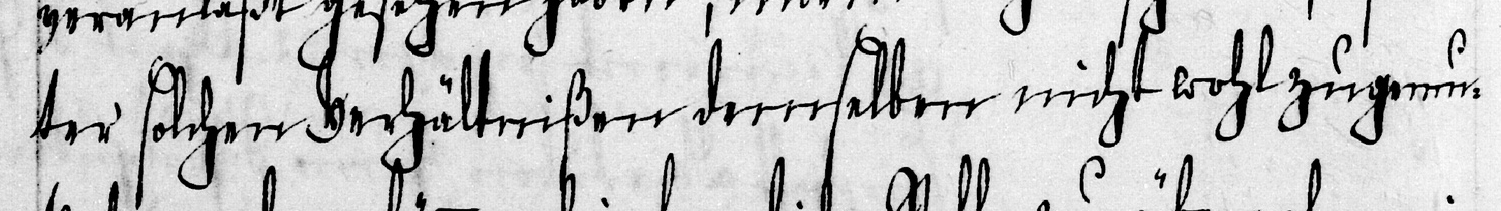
ter solchen Verhältnißen demselben nicht wohl zugemu¬
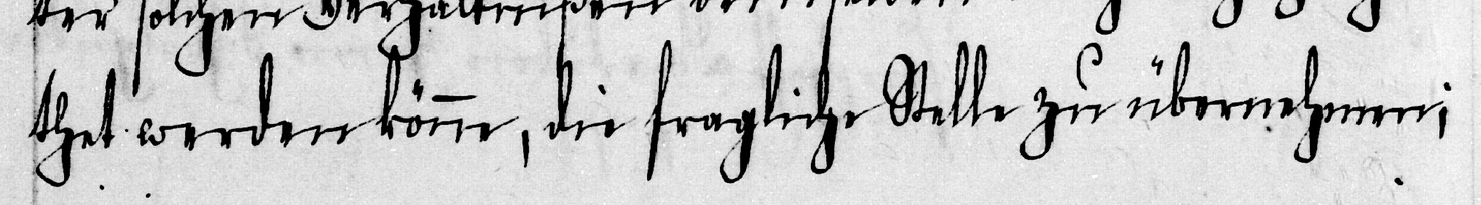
thet werden könne, die fragliche Stelle zu übernehmen;
